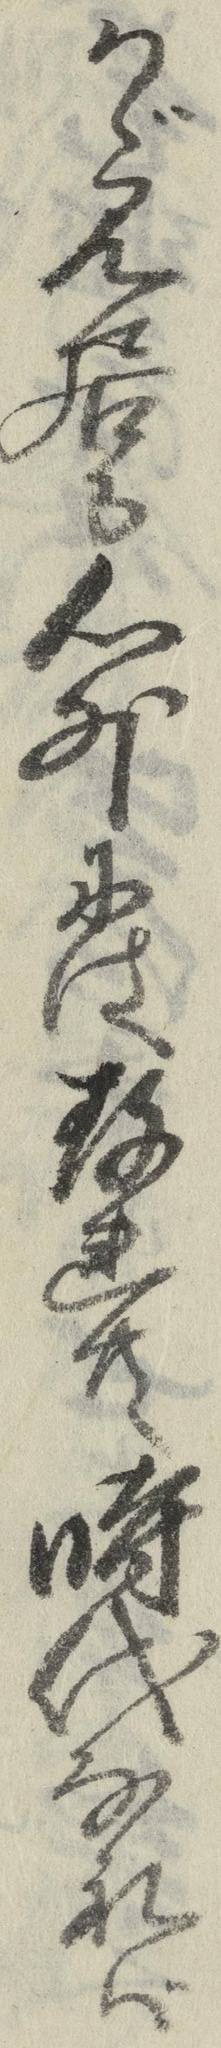かゞ見居る心外には存れ共時代なれば

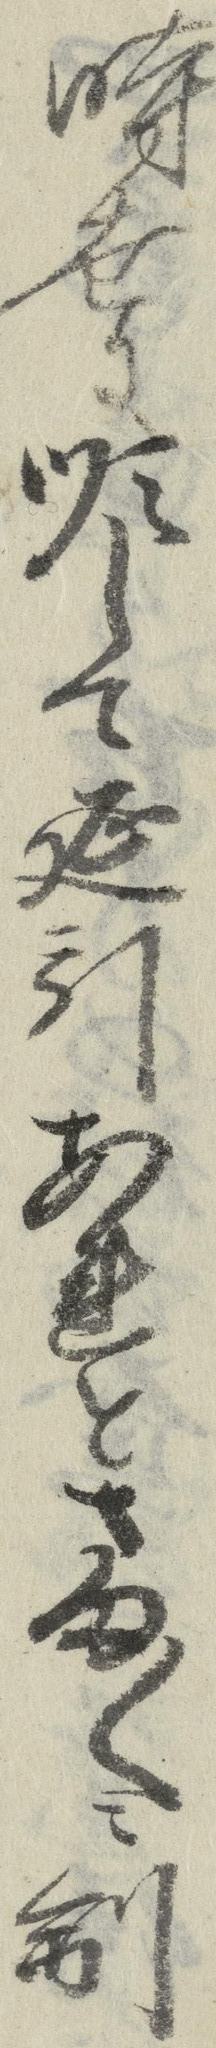時世に順して延引あれとさま〳〵に制
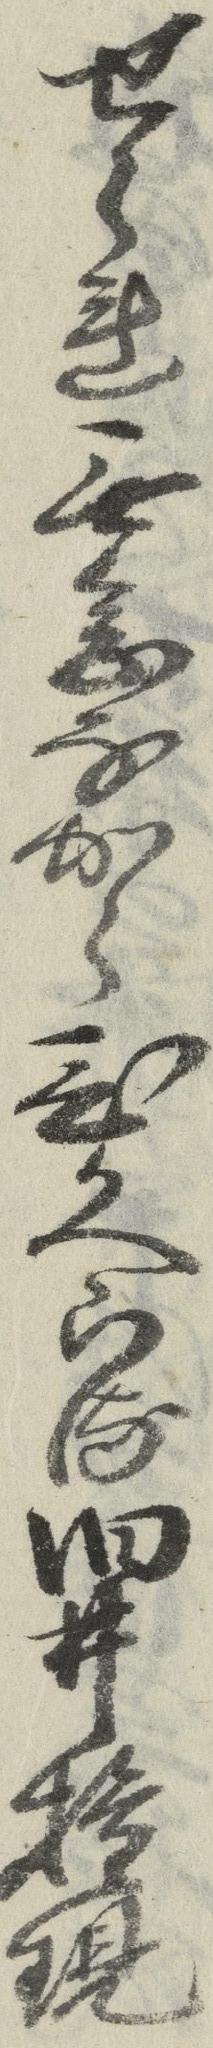せられ無念なからひかへらる旧井権現
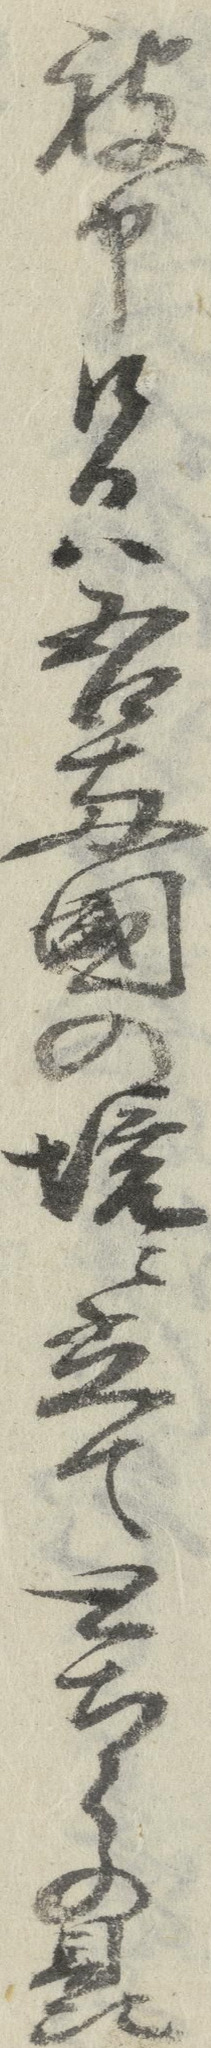被申けるは吾両国の境に立てとちらの贔
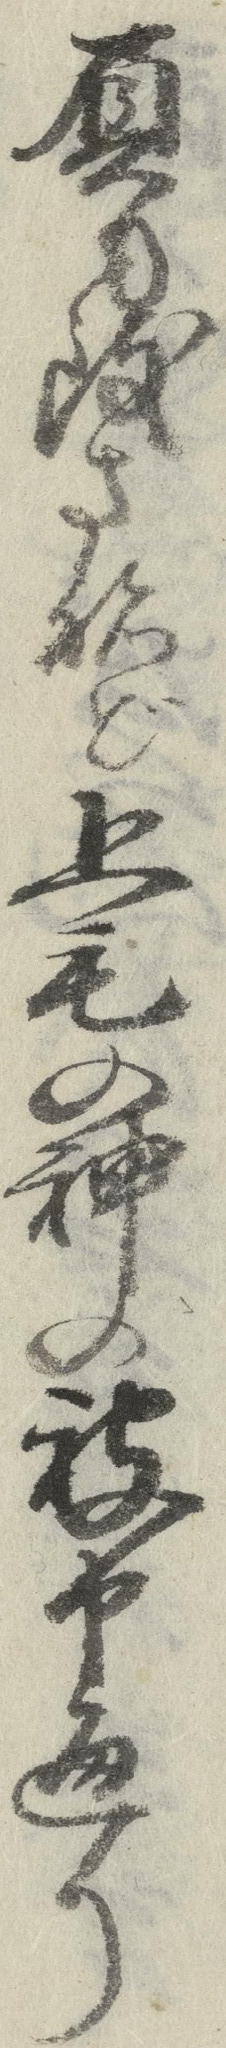屓も致さねど上毛の神の被申通り
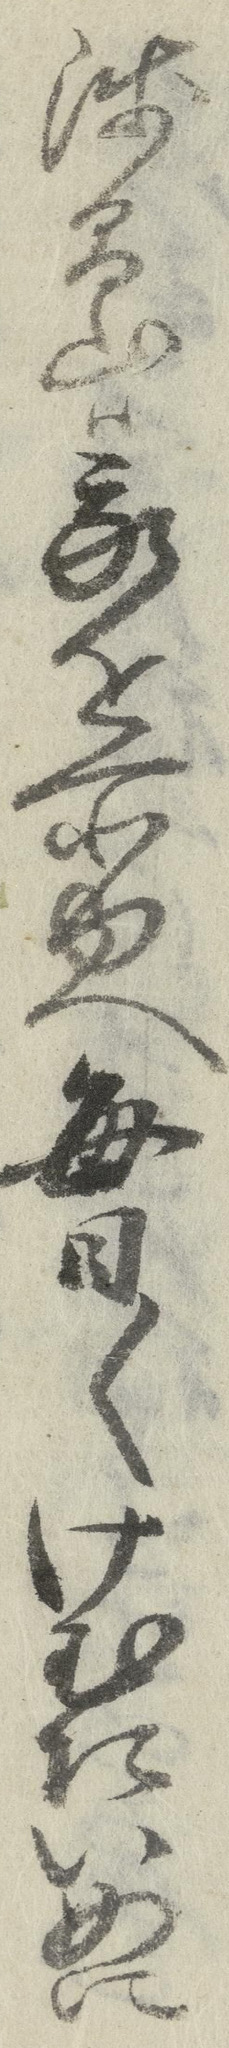浅間山は我近所ゆへ毎日〳〵けむたいめに
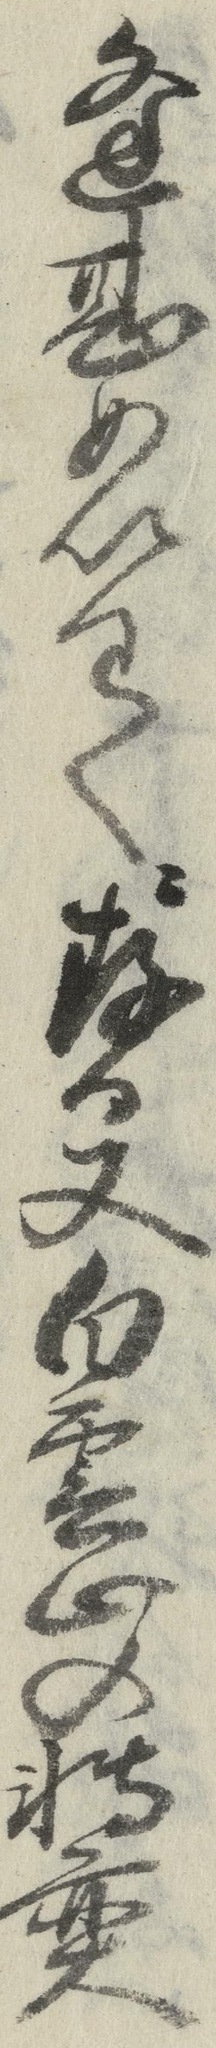逢甚めいわくに存而又白雲山の博奕
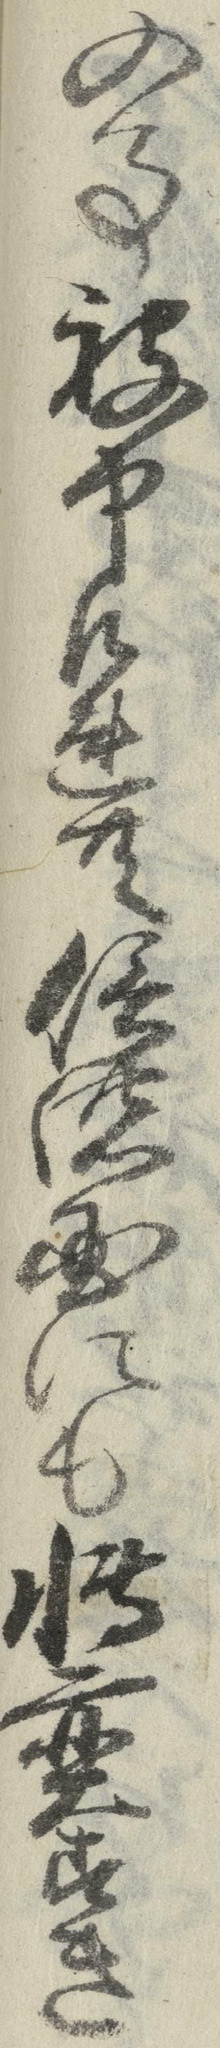の事被申けれ共信濃国にも博奕すき
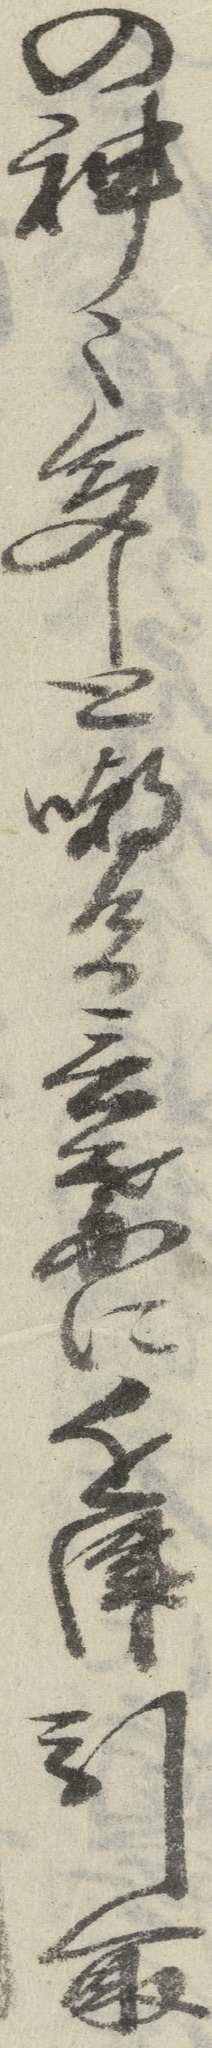の神々聞しと嘲ける言葉に近津引取
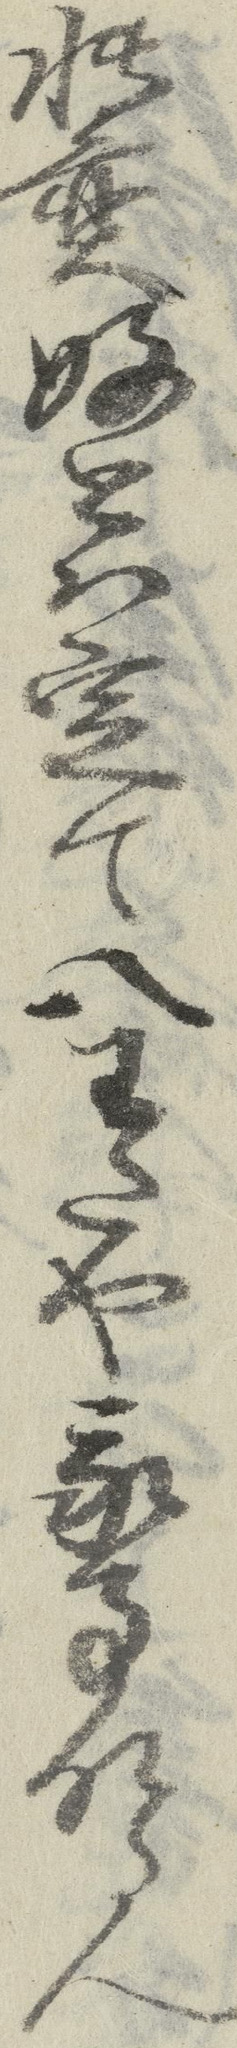博奕好とは定て八わたや我事ならん
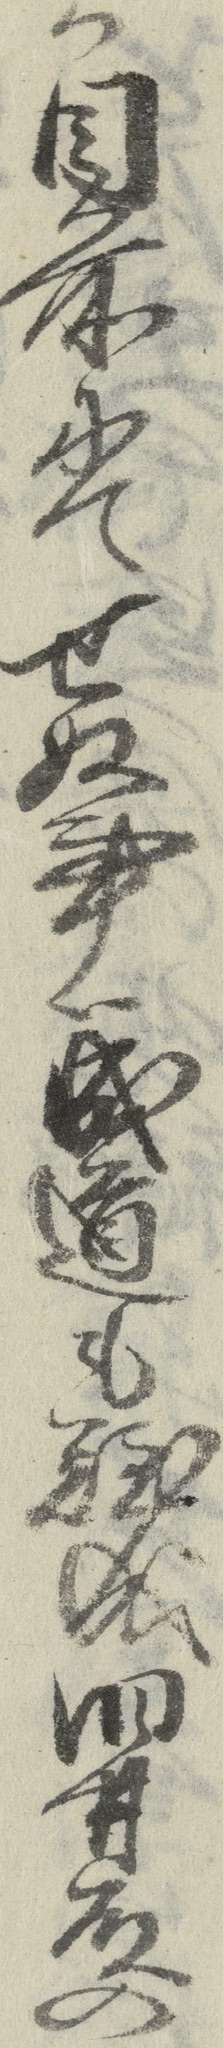か目前にてせぬ事は成道も難成旧井殿の
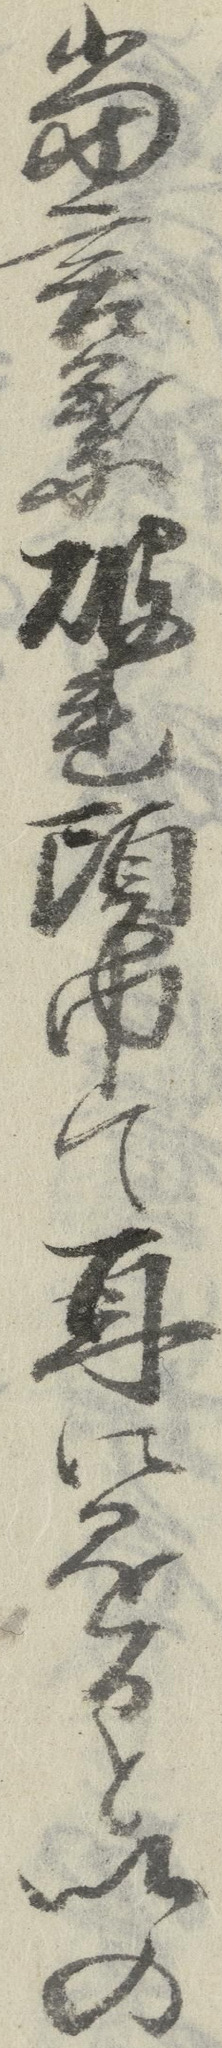当言葉破れ頭巾て耳に懸ると以の
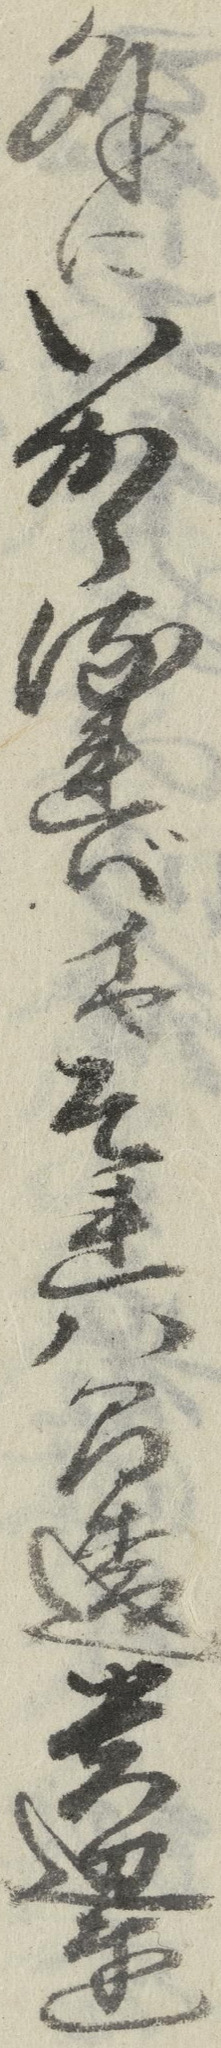外にいかゝなれば間違貴辺達
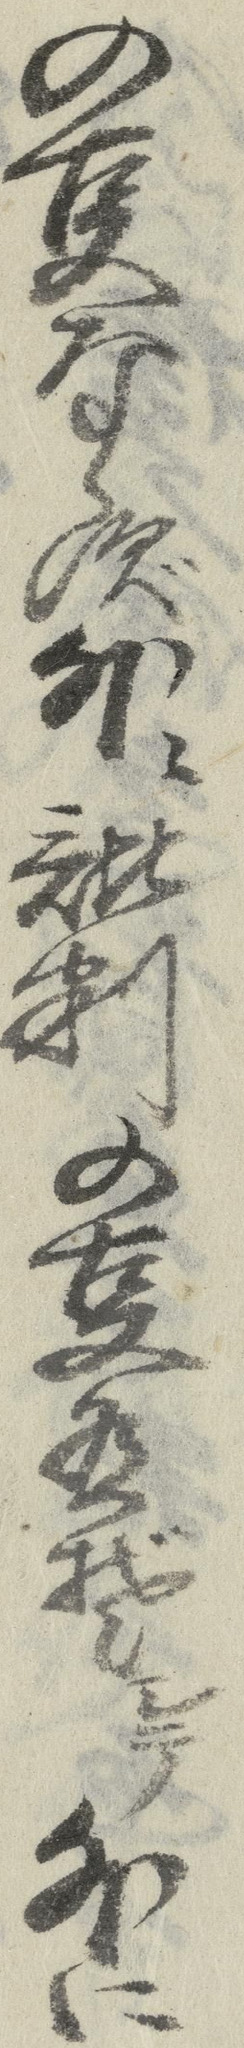の事ならず外に批判の事有ぞ外に
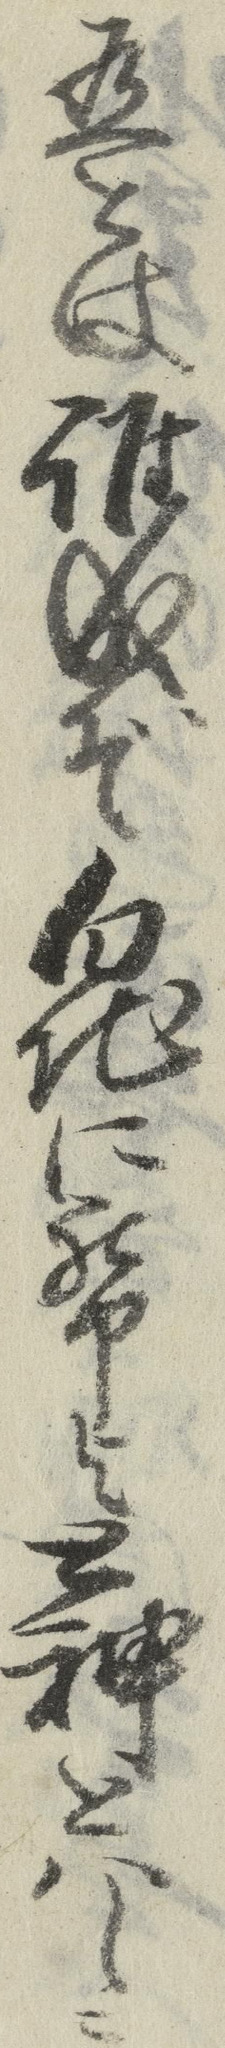有とは誰成ぞ白地に被申よと神とはしに
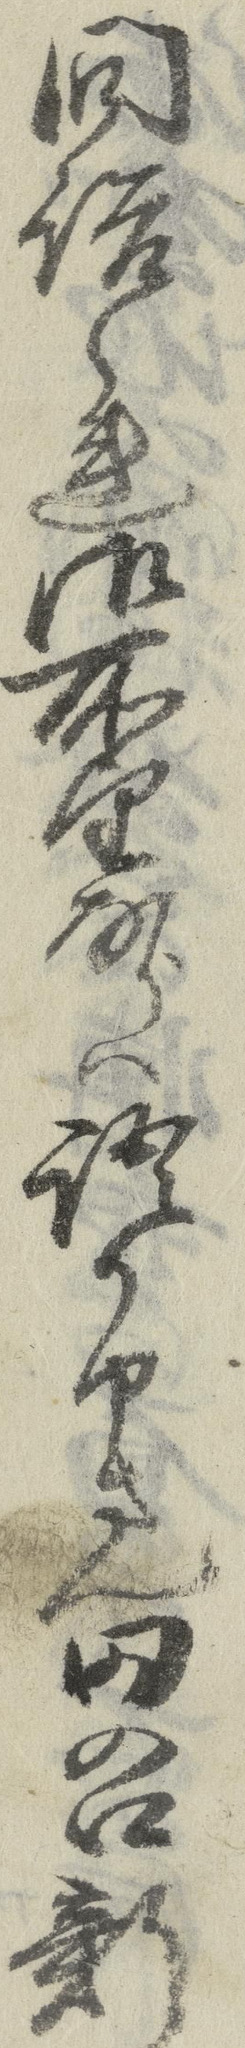問詰られ御所望ならは語り申さん田の口新
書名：浅間大焼騒動記　上
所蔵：東京大学地震研究所図書室 Earthquake Research Institute Library, The University of Tokyo, JAPAN
